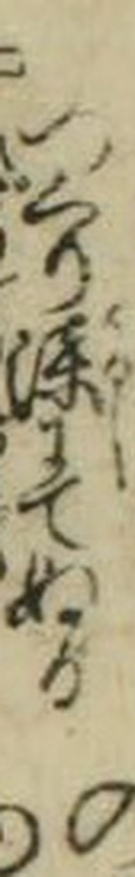つくり漆にてぬる
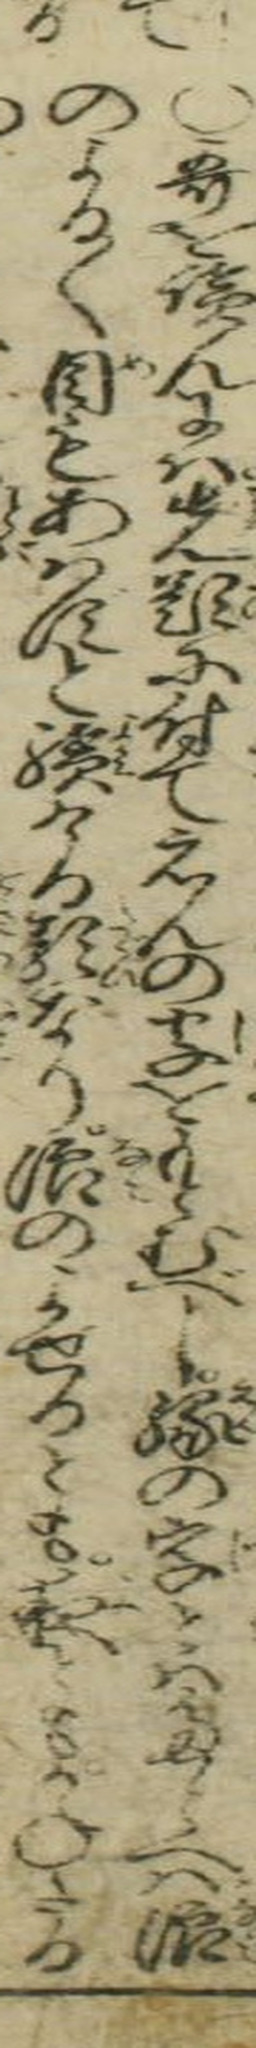のよる〳〵目もあはずと讀ける類なり。浪のよせるとも。夜とも。かねたる
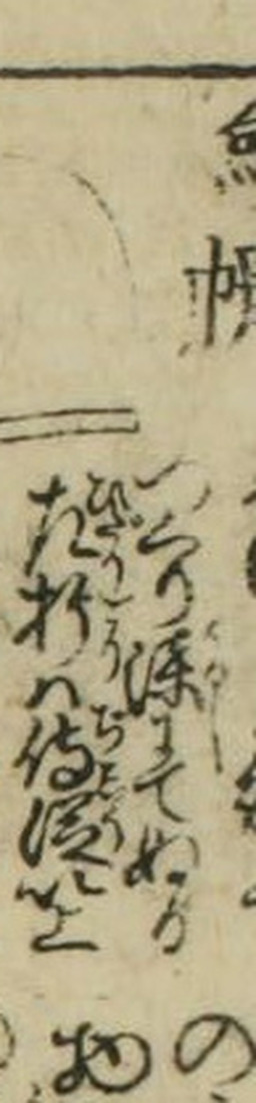左折は侍從以上
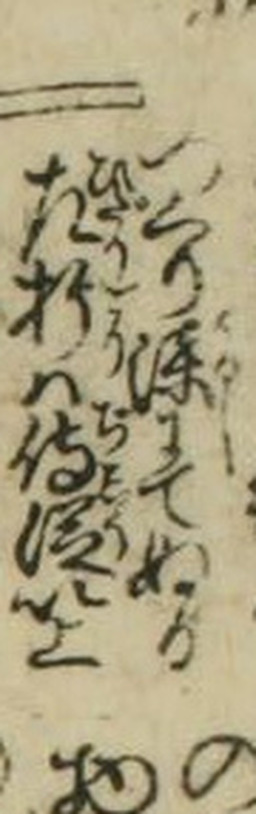左折は侍從以上
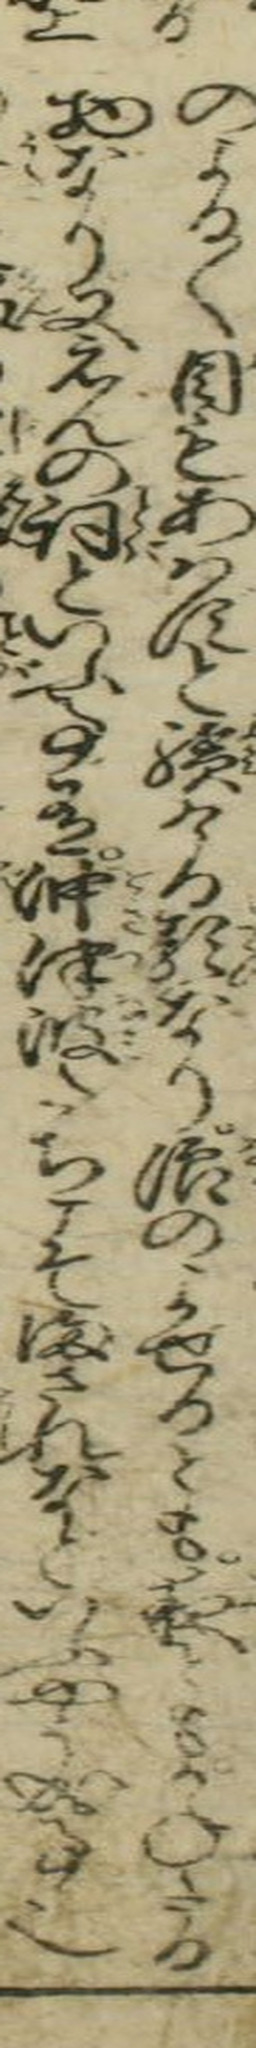物なり。又えんの詞といふ事有。沖津波たちこそまされなどいふやう成事也
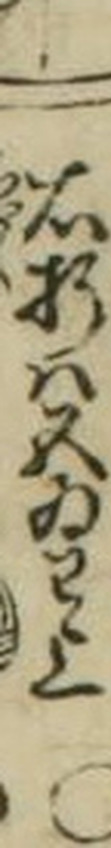右折は五ゐ已上
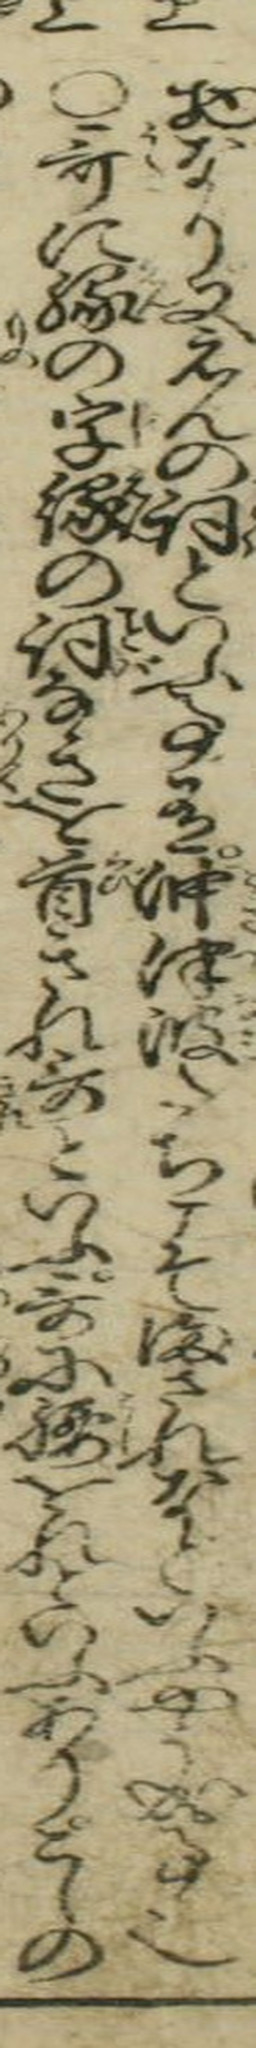○哥に縁の字縁の詞なきを首きれ哥と云ふ。哥に腰をれといふあり。こしの
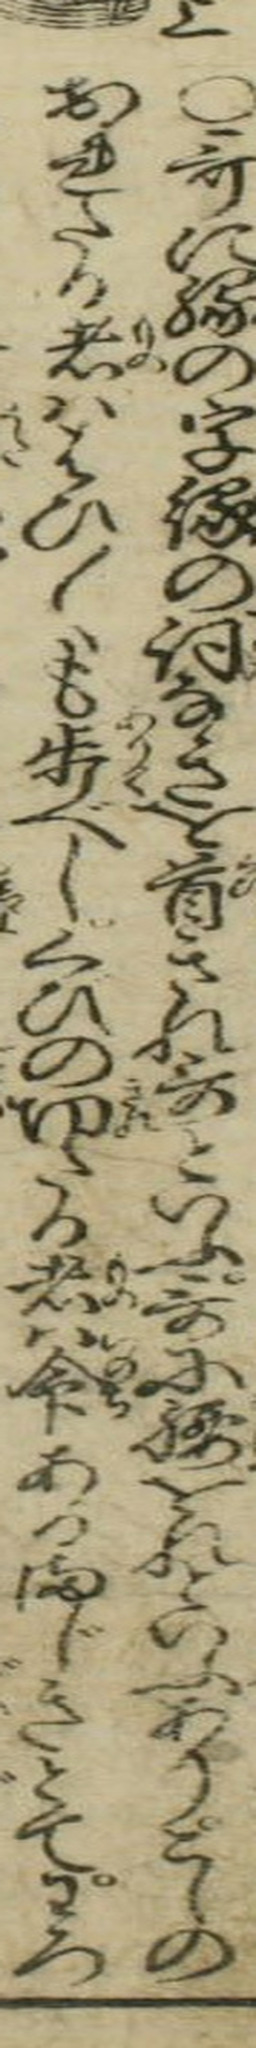おれたる者ははひ〳〵も歩べし。くひの切たる者は命あるまじきとて。わろ
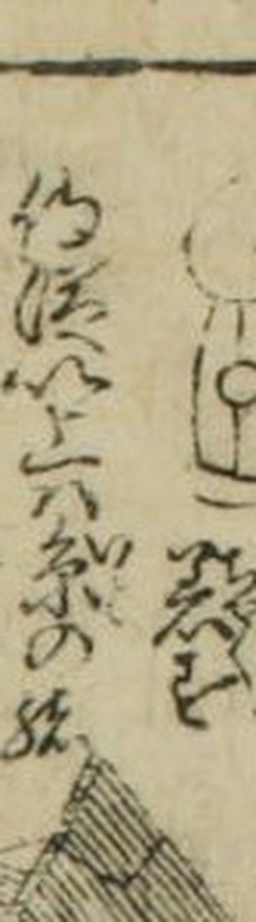侍從以上は糸の緒
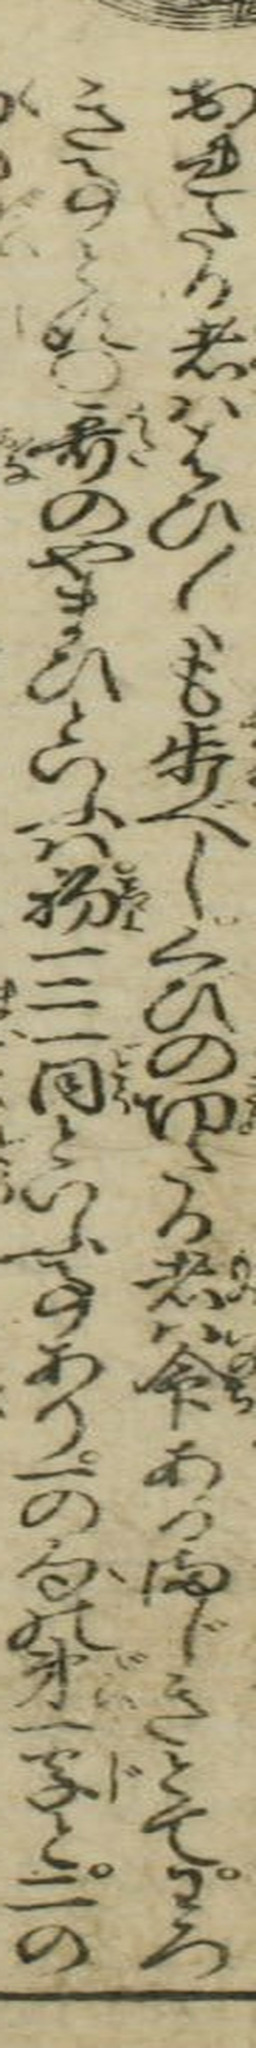き事とす○哥のやまひといふは。初一二一同といふ事あり。一の句の第一字と。二の
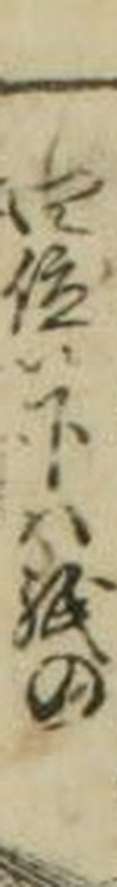四位以下は紙の
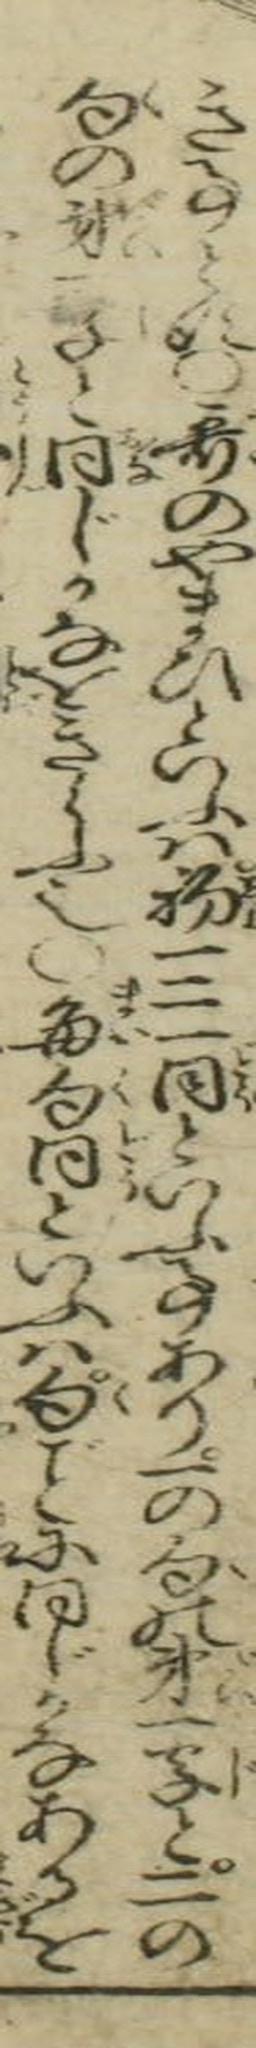句の第一字と同じかなをきらふ也○毎句同といふは。句ごとに同じかなあるを
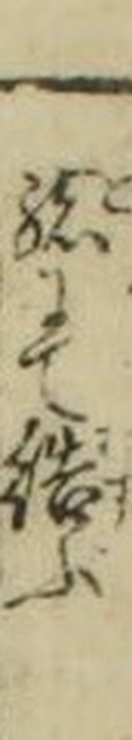緒にて結ぶ
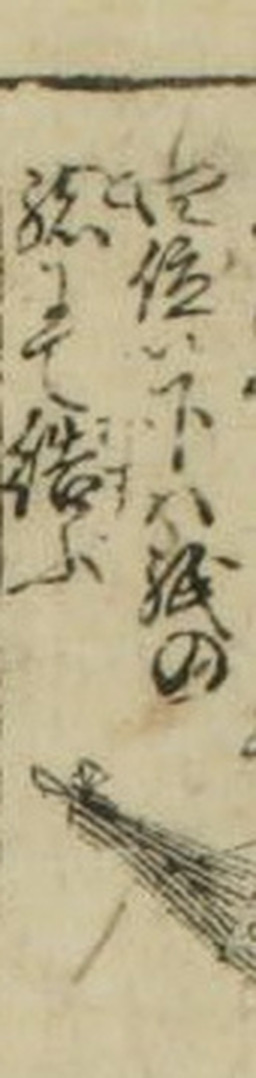緒にて結ぶ
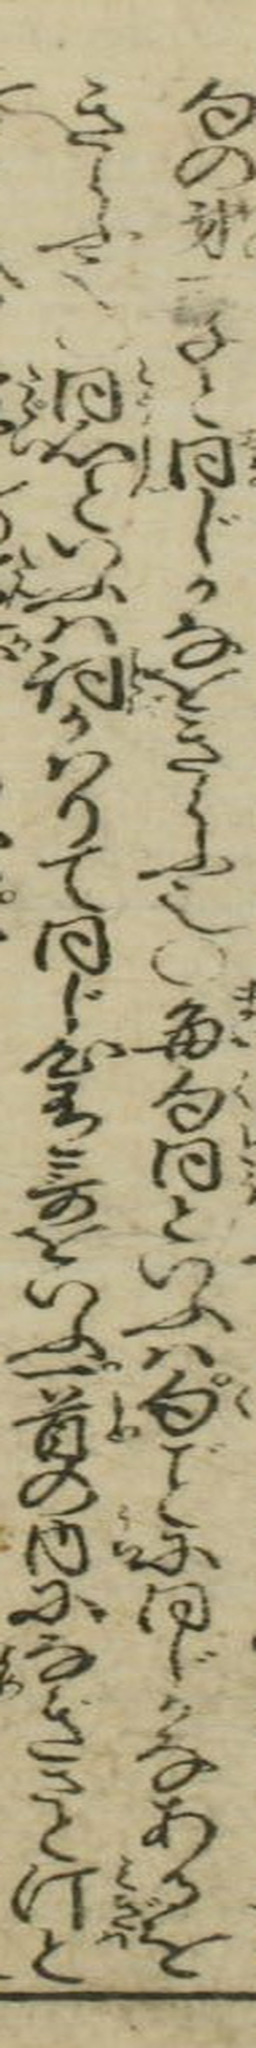きらふ也○同心といふは詞かはりて同じ心有哥をいふ。一首の内になぎさと汀と
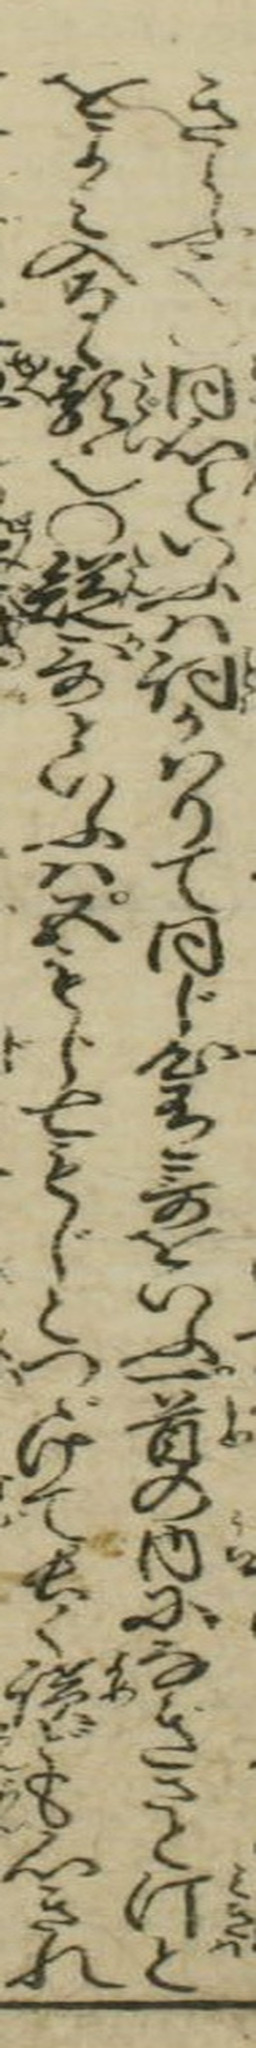をよみ入るゝ類也○短哥といふは。五もじ七もじとつゞけて長く讀ども心きれ
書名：女源氏教訓鑑
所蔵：東京学芸大学附属図書館
